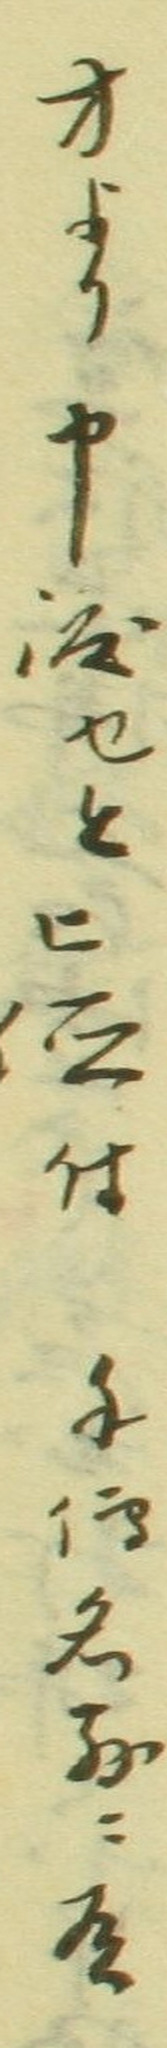方より申渡也と被仰付手伝名前ニ有

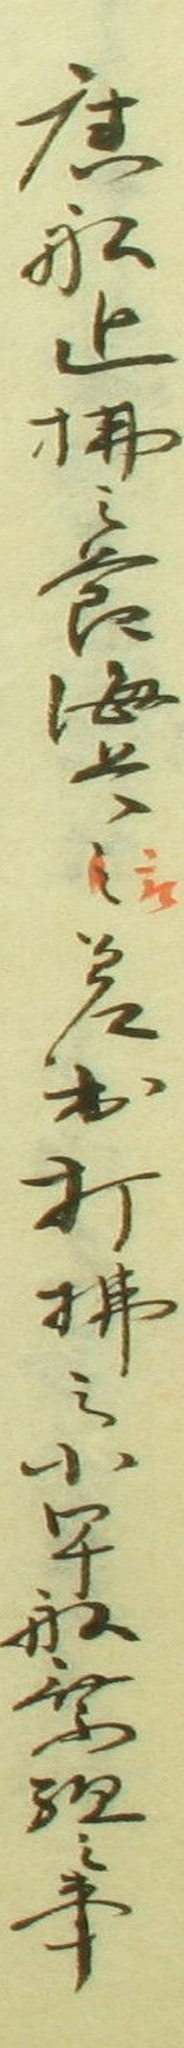唐船止払之節海兵被差出打払之小早船乗組之事
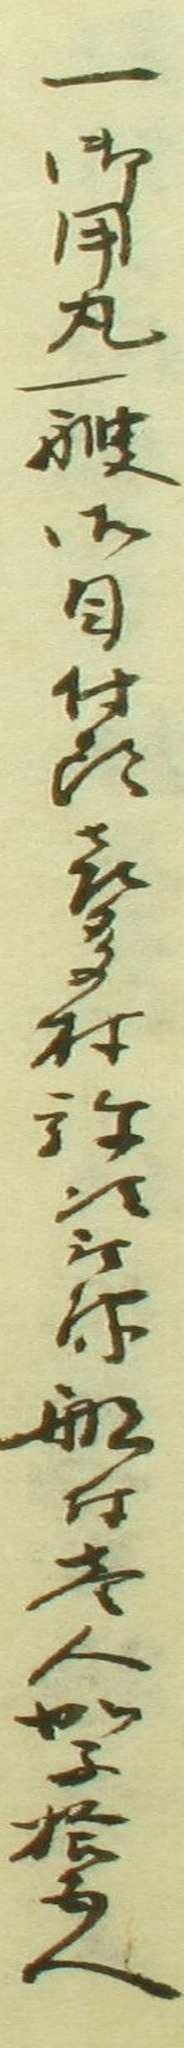一御用丸一艘御目付頭喜多村弥次兵衛船付壱人加子拾五人
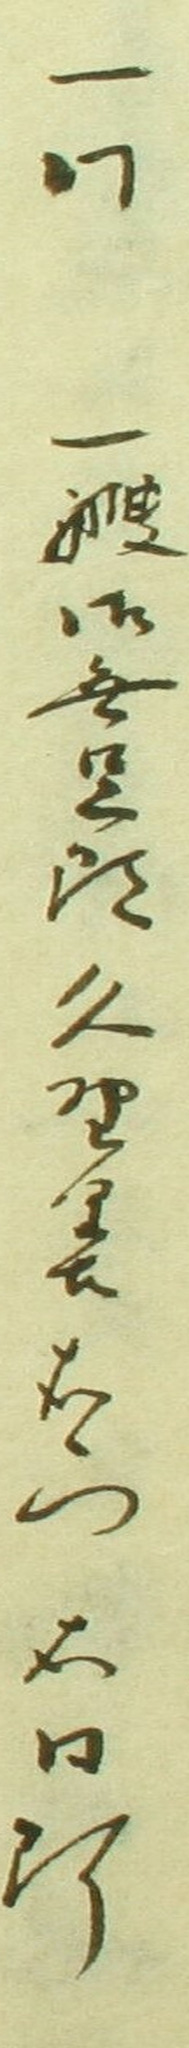一同一艘御無足頭久野善右衛門右同断
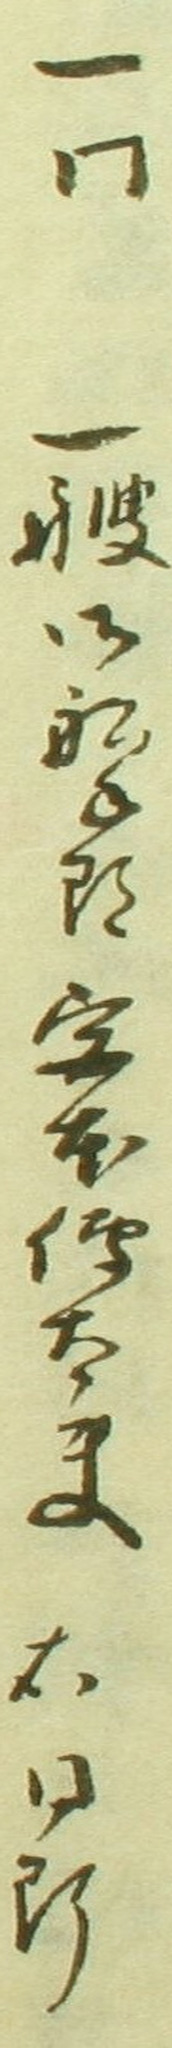一同一艘御船手頭宮本傳太夫右同断
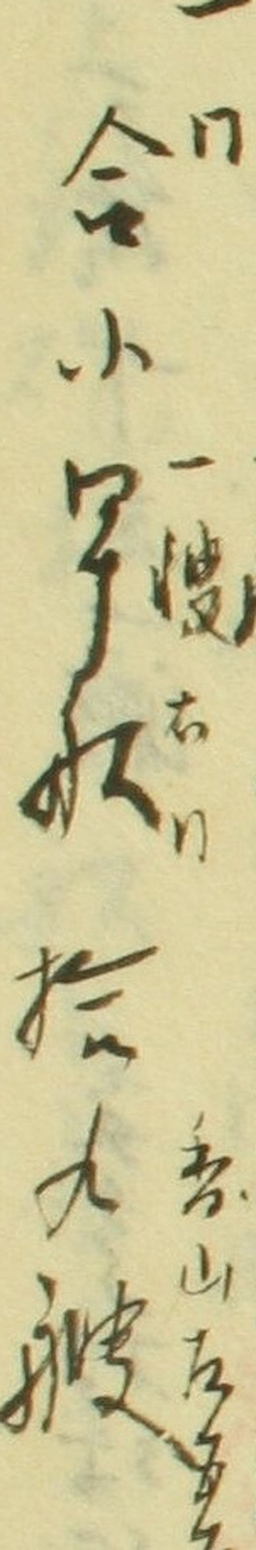合小早船拾九艘

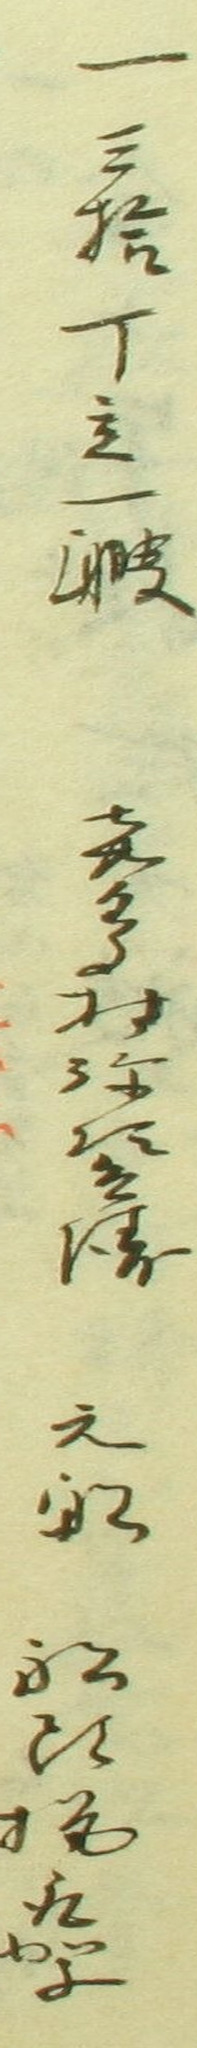一三拾丁立一艘喜多村弥次兵衛元船船頭梶取加子
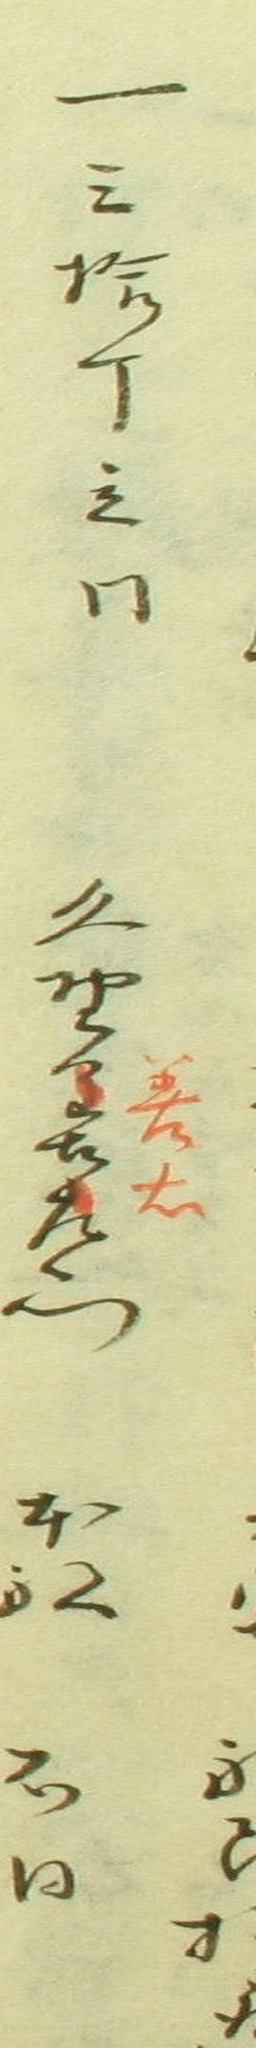一三拾丁立同久野善右衛門本船右同
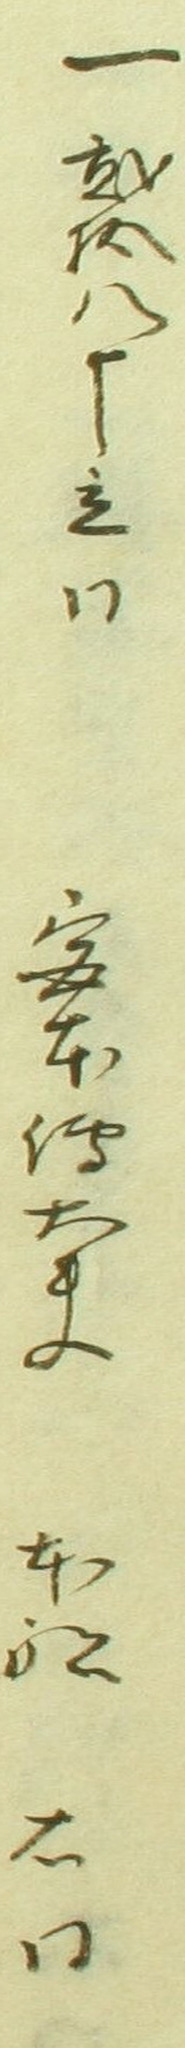一弐拾八丁立同宮本傳太夫本船右同
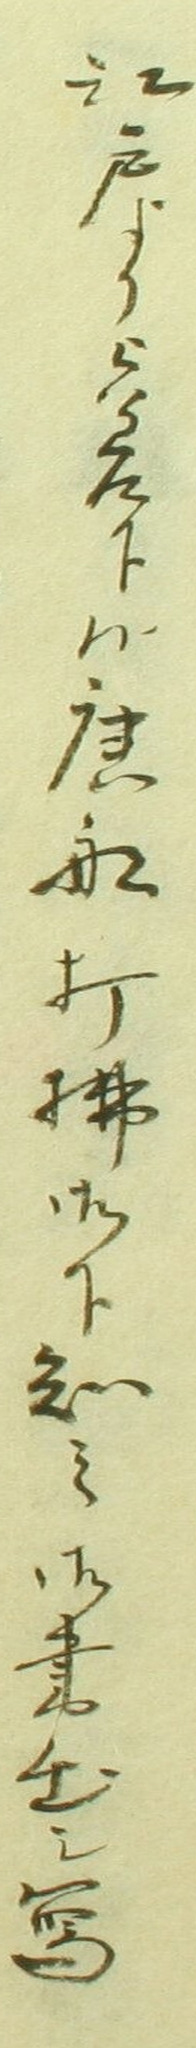江戸より被差下候唐船打払御下知之御書出し写
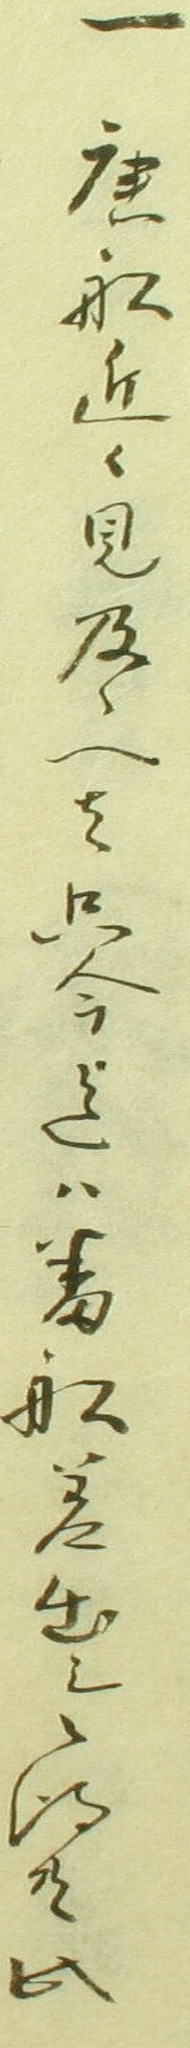一唐船近く見及候へは只今迄は番船差出し候得共此
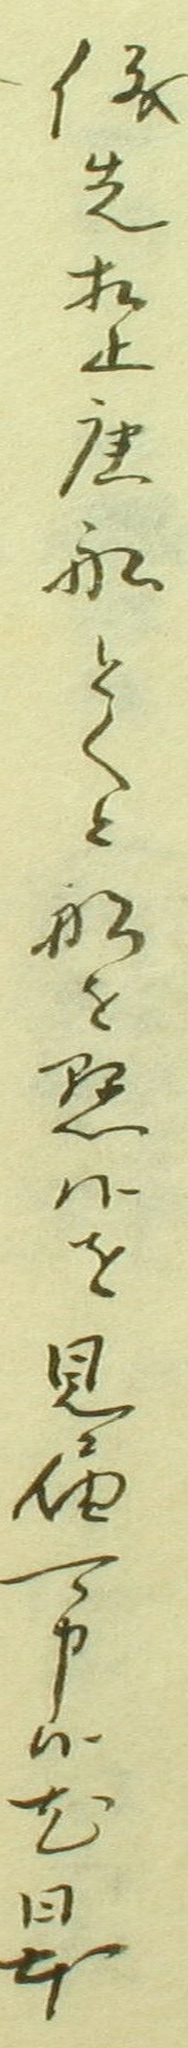儀先相止唐船とくと船を隠候を見届可申候尤日本
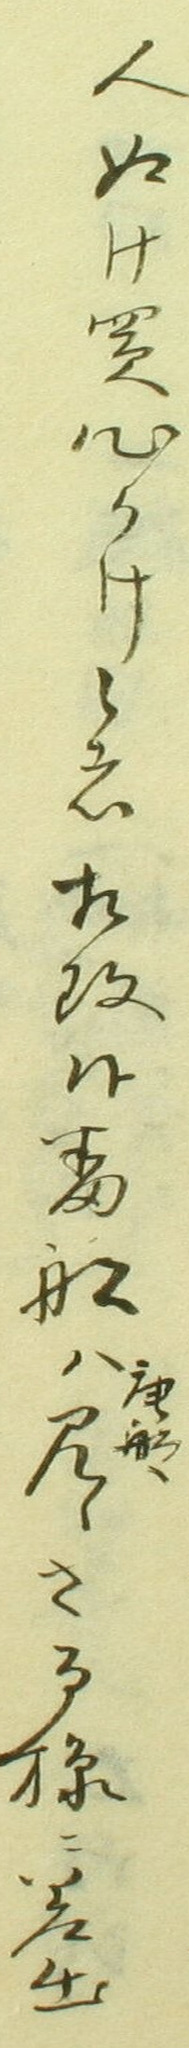人ぬけ買心かけ候者相改候番船は唐船見さる様ニ差出
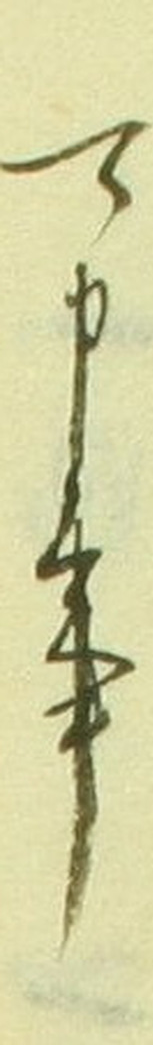可申事
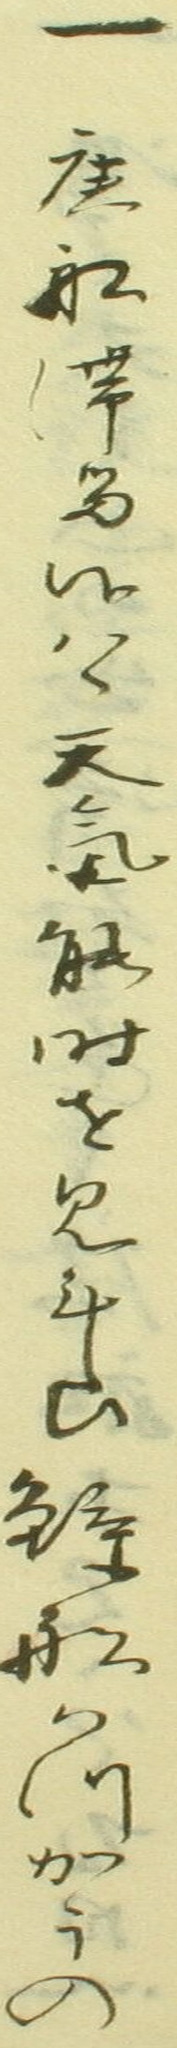一唐船滞留候はゝ天気能時を見計ひ鯨船か川からの
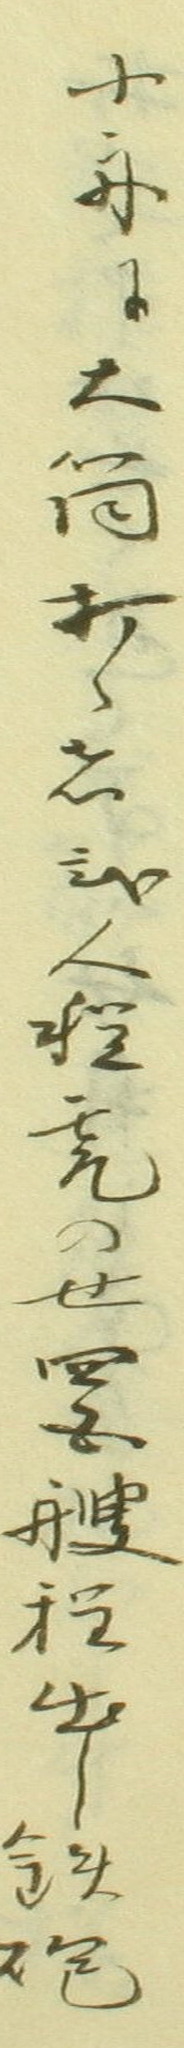小舟に大筒打之者弐人程ものせ四五艘程出し鉄砲
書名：唐船漂流記 二
